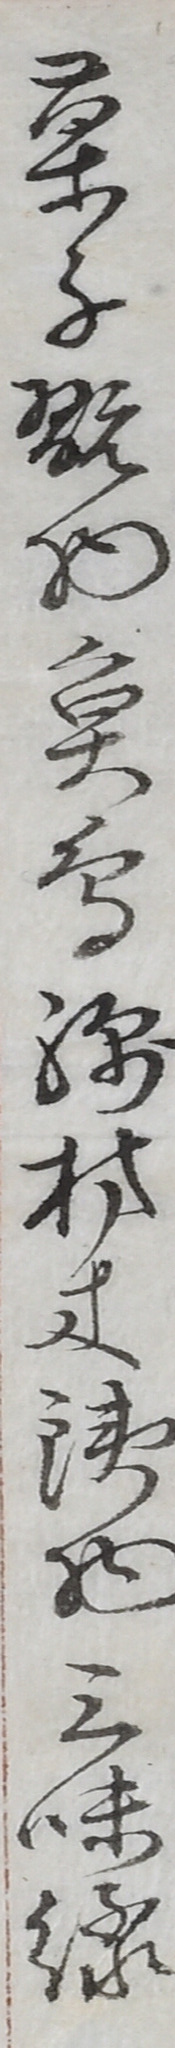菓子翫物魚鳥綿材木鉄物三味線
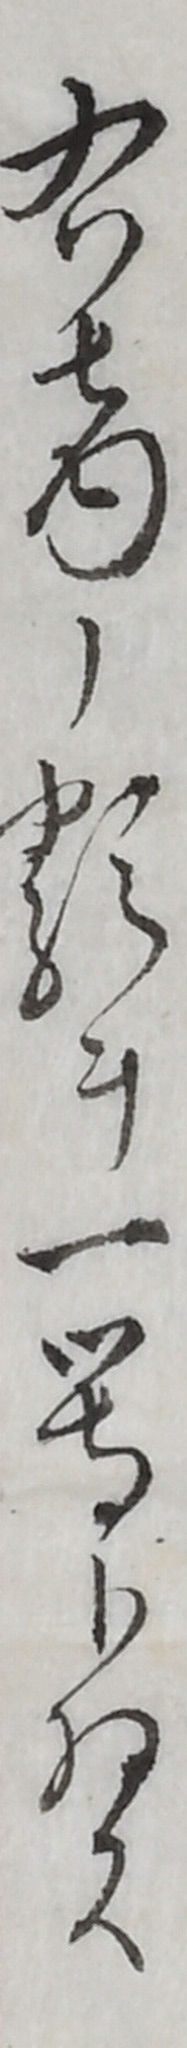右商ノ類ヲ一等ト為ス
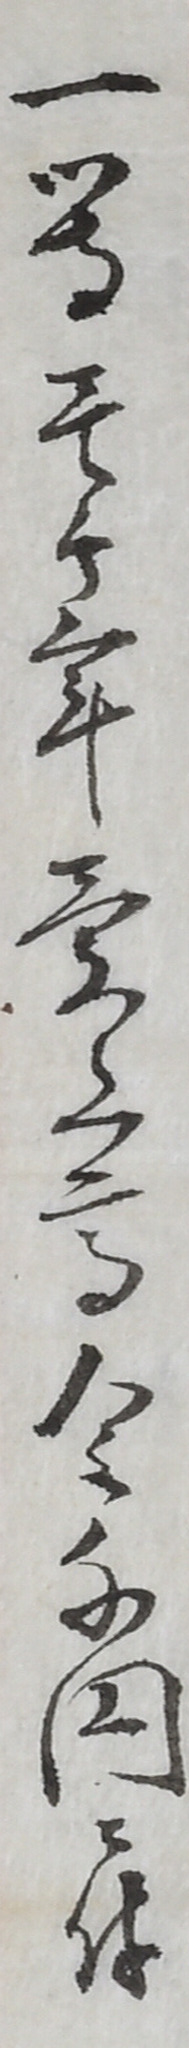一等壱ヶ年売上高金千円ニ付
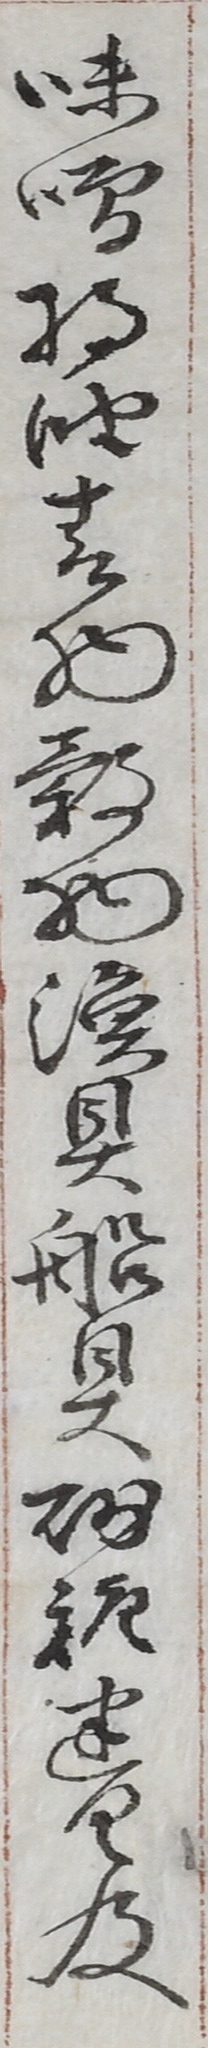味噌醤油青物穀物漁具船具砂糖建具及
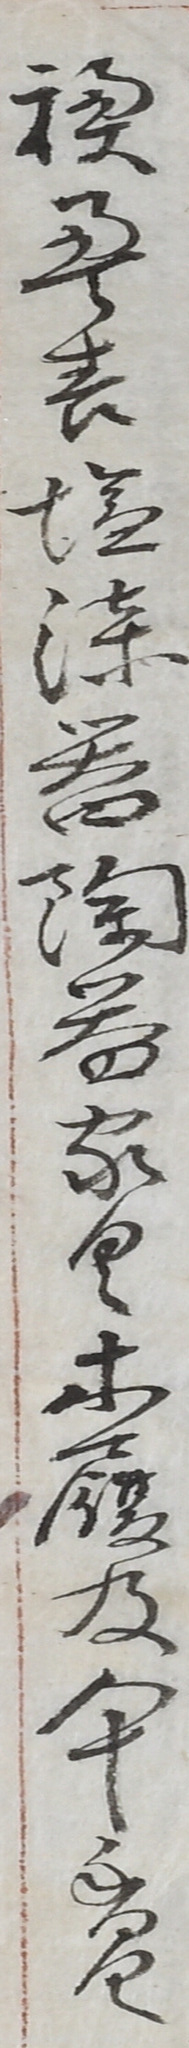襖畳表塩漆器陶器陶器家具木履及傘香具
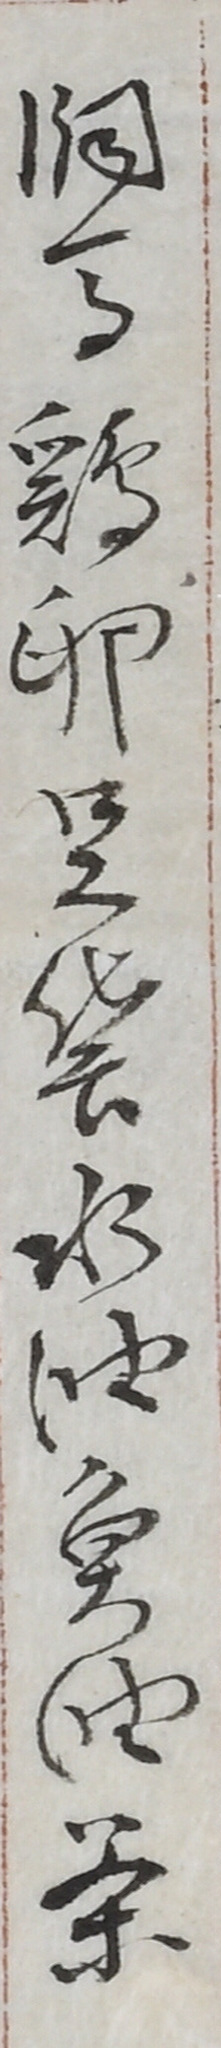飼馬鶏卵足袋水油魚油茶
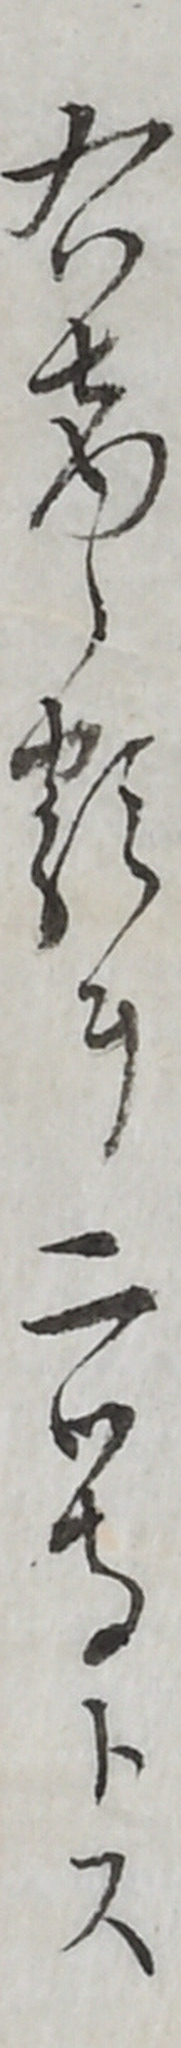右商之類ヲ二等トス
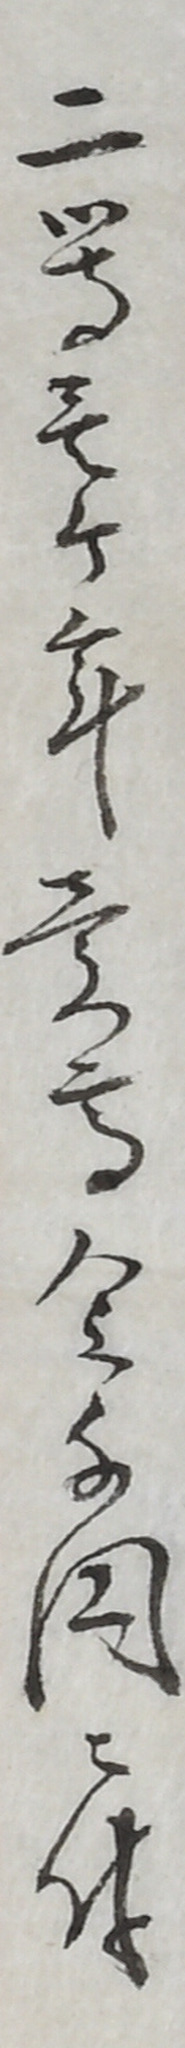二等壱ヶ年売高金千円ニ付
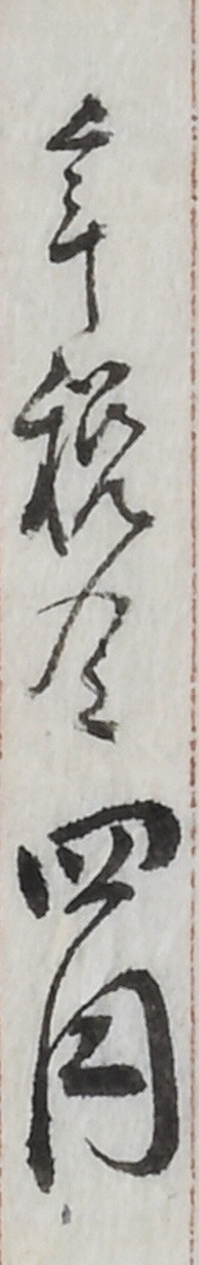年税金四円

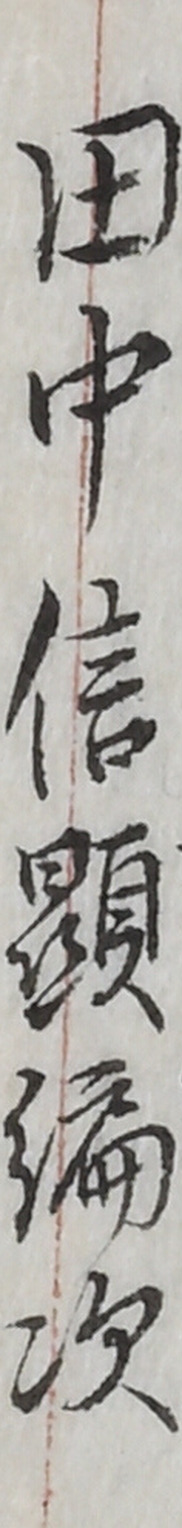田中信顕編次
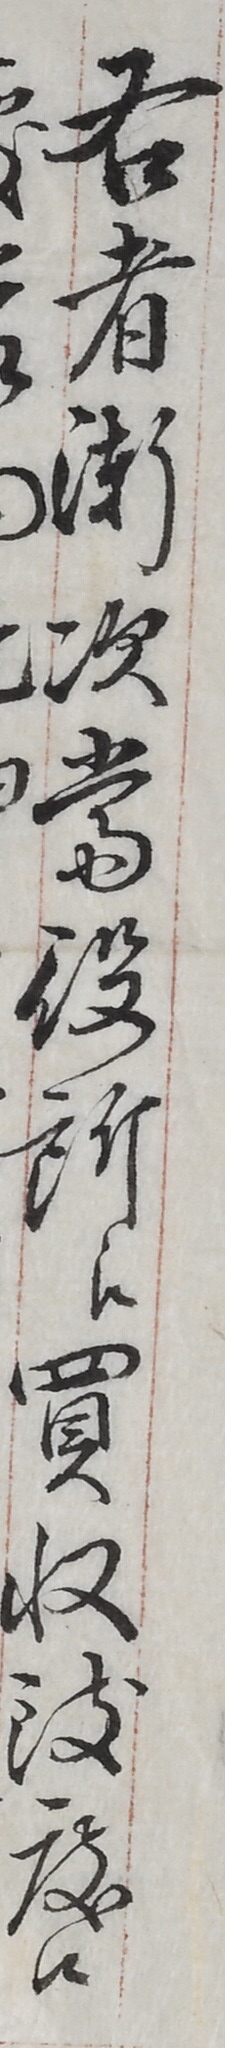右者漸次当役所え買収致度候
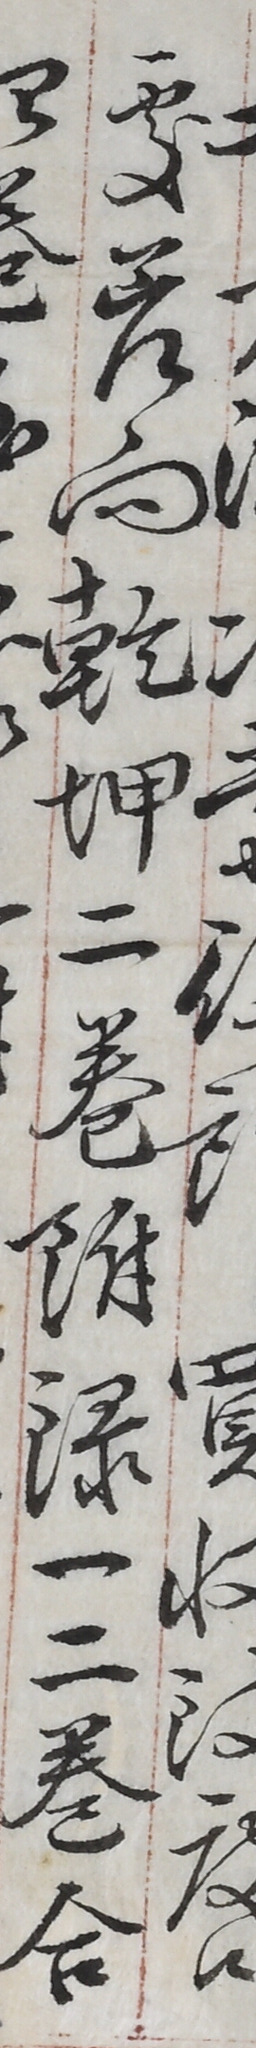処差向乾坤二巻附録一二巻合
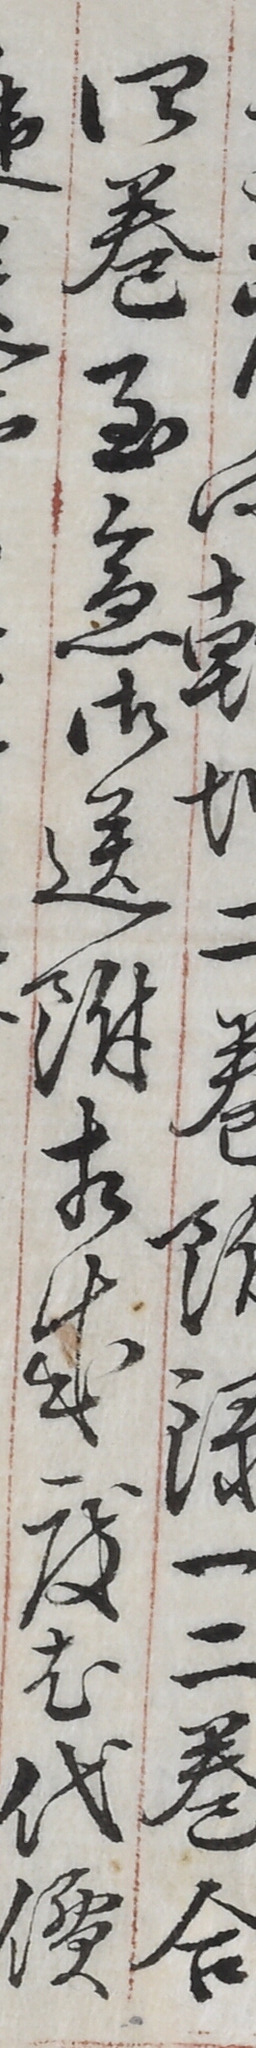四巻至急御送附相成度尤代価
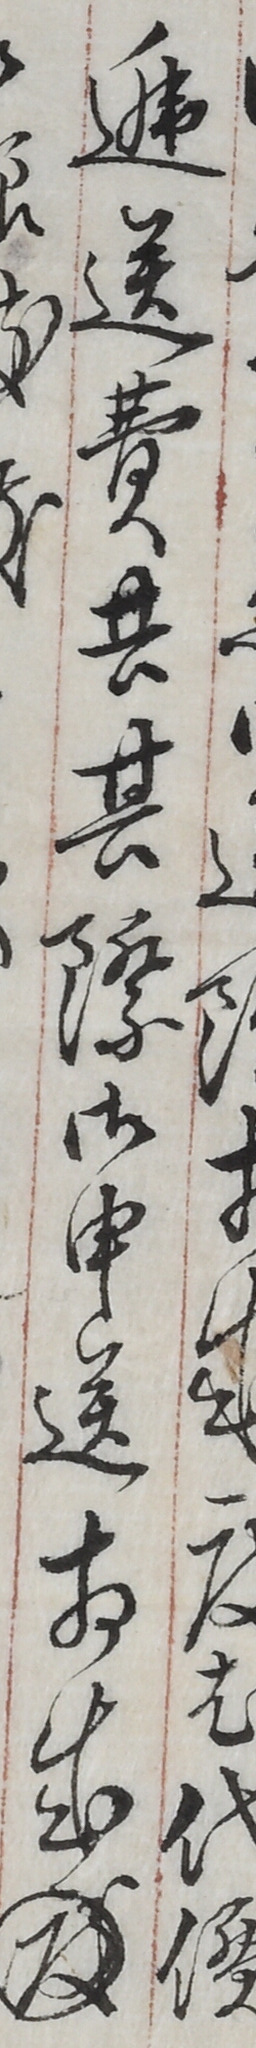逓送費共其際御申送相成度
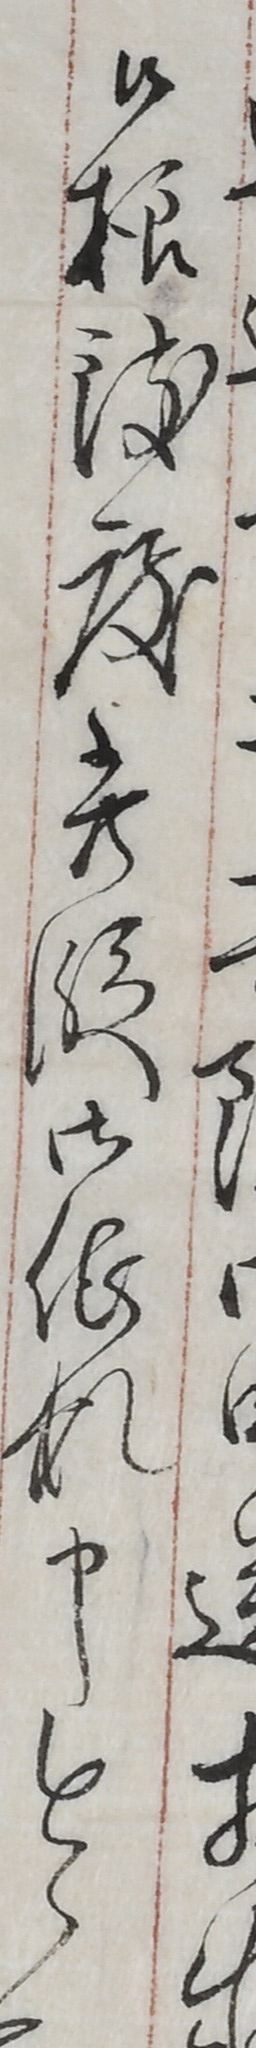候様致度此段御依頼申進候也

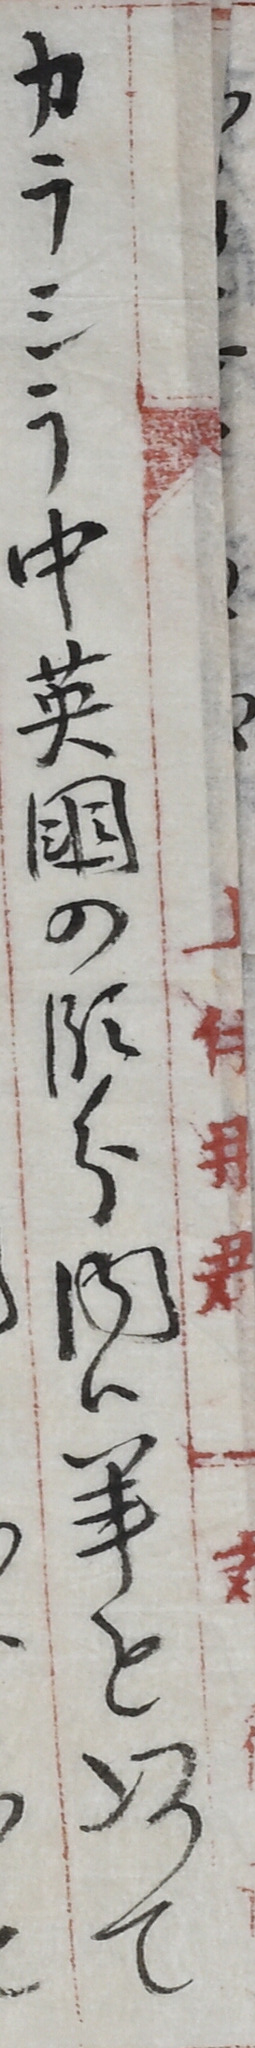カラシテ中英国の領分内は羊を以て
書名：郡役所勤務中御用抜書
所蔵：伊那市立高遠町図書館・合同会社AMANE
